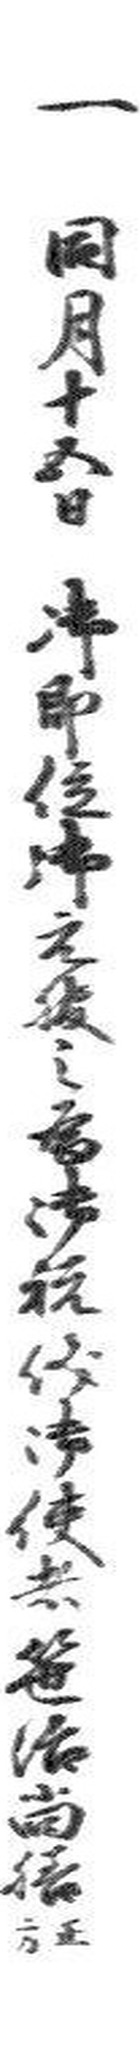一同月十五日御即位御元服之為御祝儀御使者笹治尚膳正方

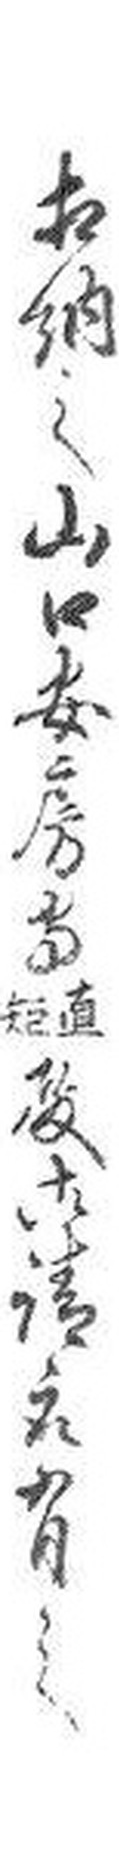相納之山口安房守直矩殿御請取有之
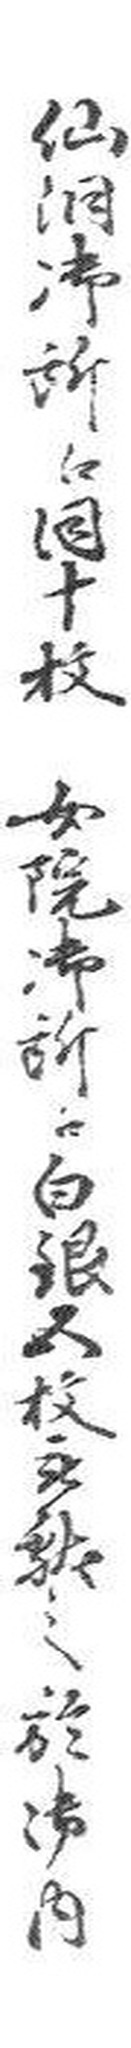仙洞御所江同十枚女院御所江白銀五枚被献之於御内
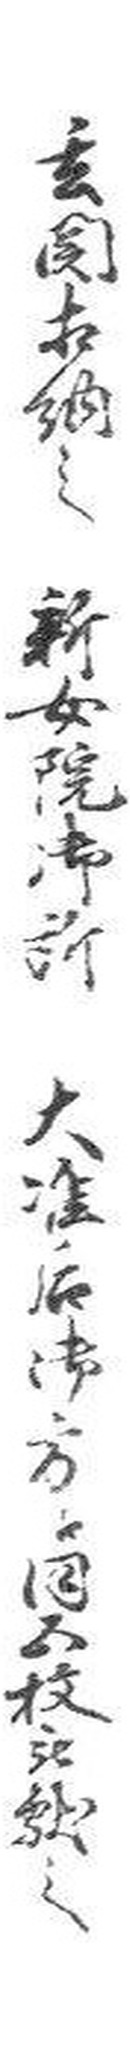玄関相納之新女院御所大准后御方江同五枚被献之
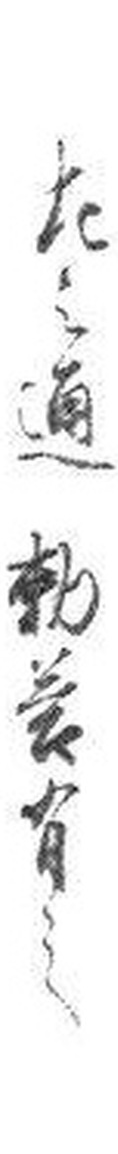左之通勅答有之
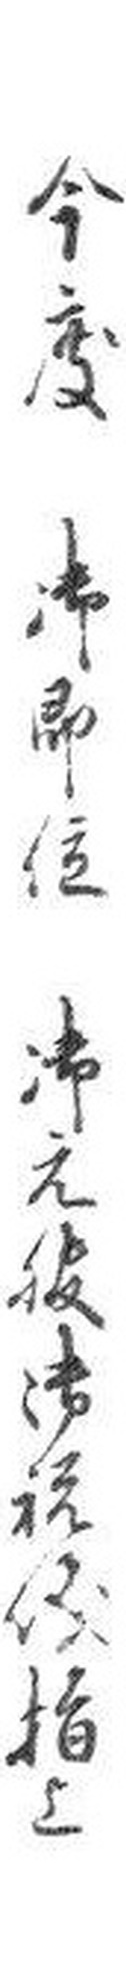今度御即位御元服御祝儀指上
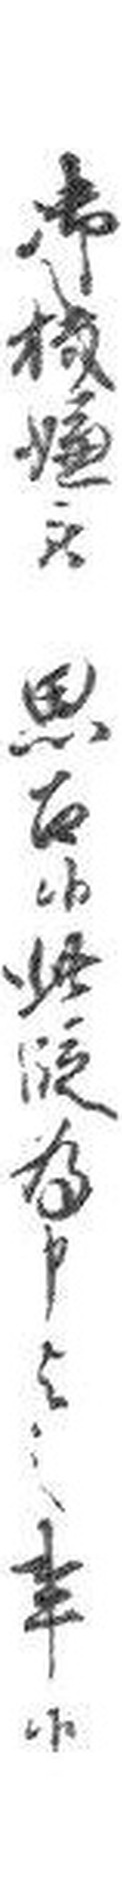御機嫌被思召候此段為申与之事候
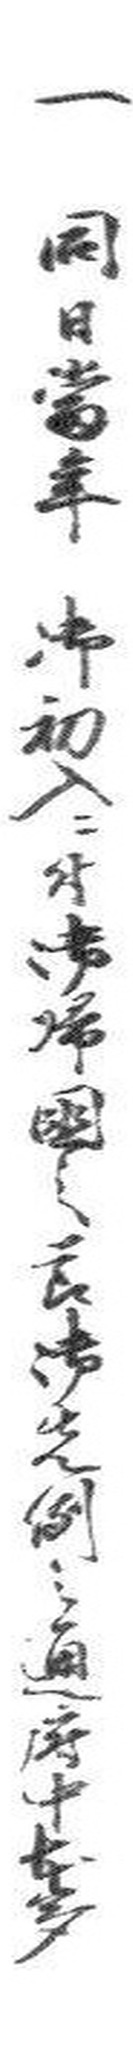一同日当年御初入ニ付御帰国之節御先例之通府中本多
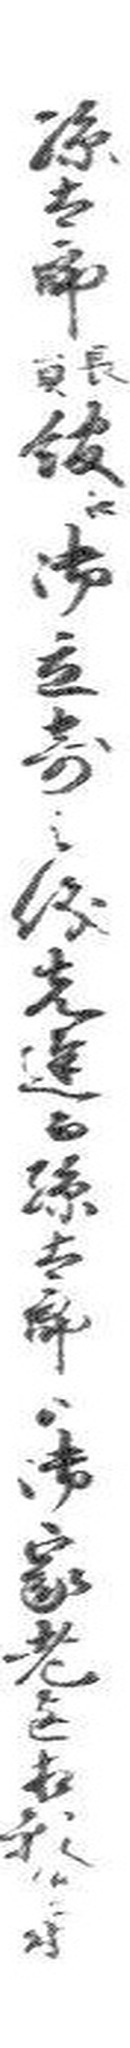孫太郎長員館江御立寄之儀先達而孫太郎ゟ御家老迄相願候ニ付
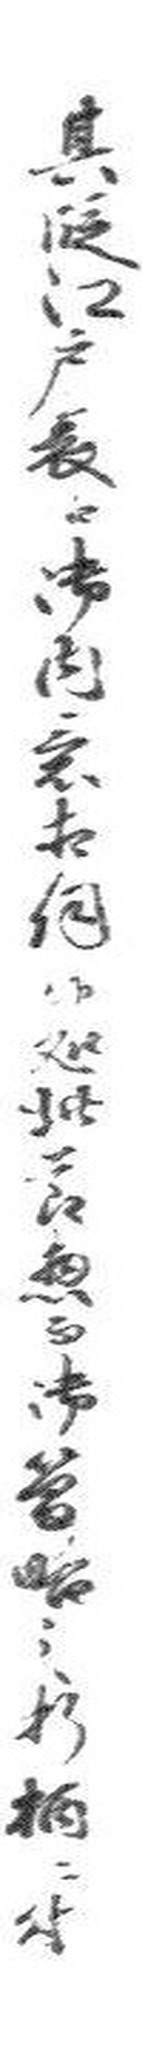其段江戸表江御内意相伺候処此節惣而御簡略之折柄ニ付
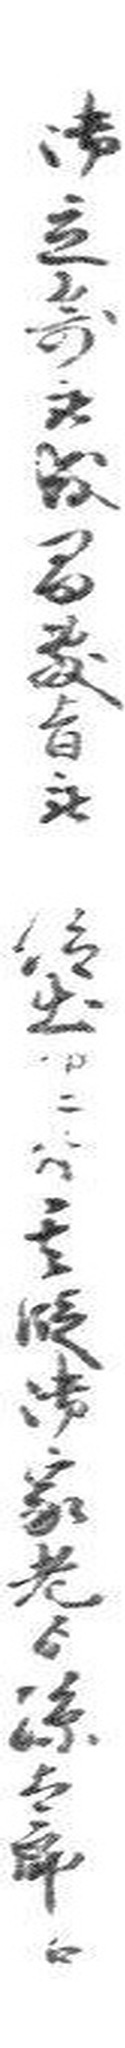御立寄被成間敷旨被仰出候ニ付其段御家老ゟ孫太郎江
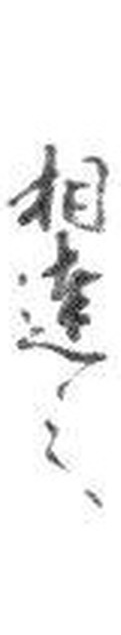相達之
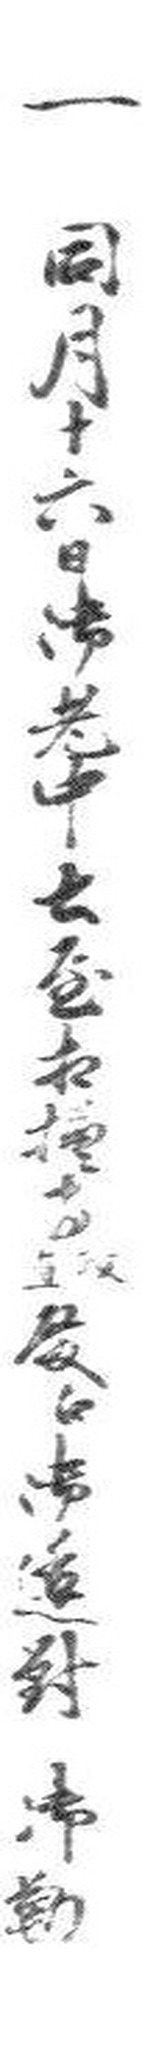一同月十六日御老中土屋相模守政直殿江御逢對御勤
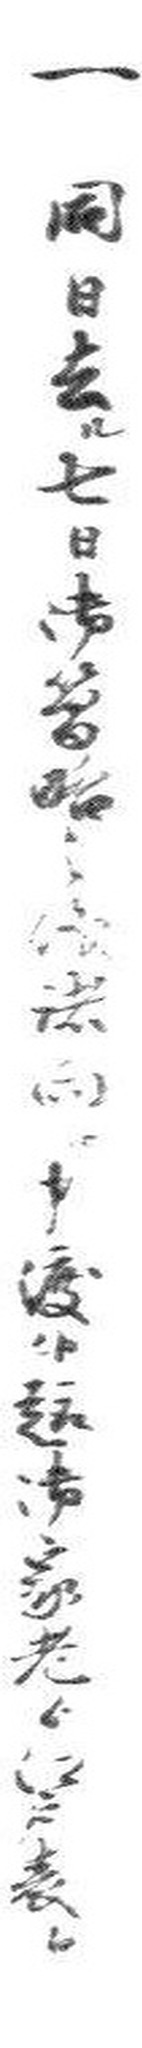一同日去ル七日御簡略之儀諸向江申渡候趣御家老ゟ江戸表江
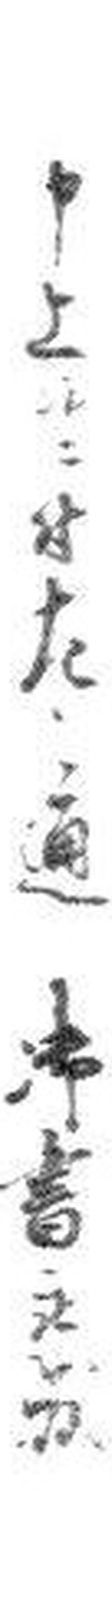申上候ニ付左之通御書被成
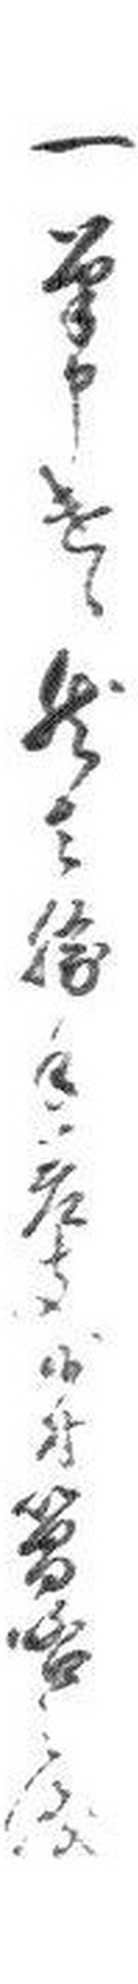一筆申遣候然者勝手差支候付簡略之儀
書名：家譜 二十八 吉邦公 従宝永七年七月五日到正徳元年十二月
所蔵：福井県文書館 Fukui Prefectural Archives
